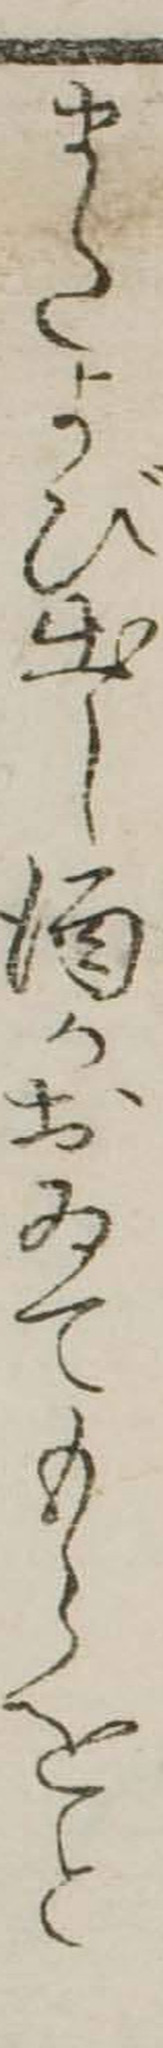またよび出し酒かおゐてもらをと
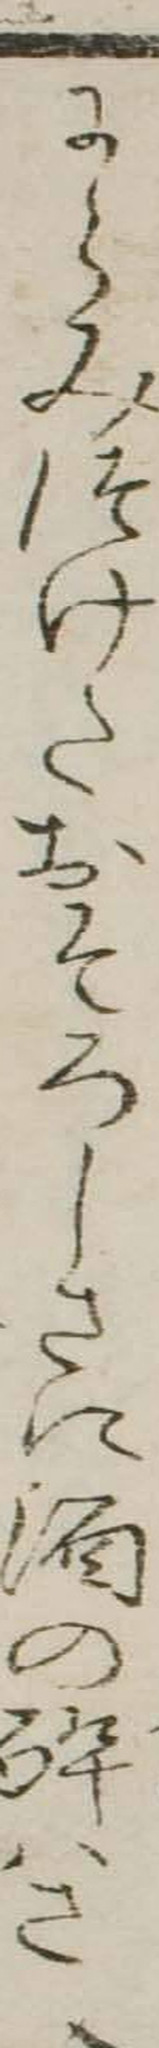にらみつけたおそろしさに酒の酔はさ
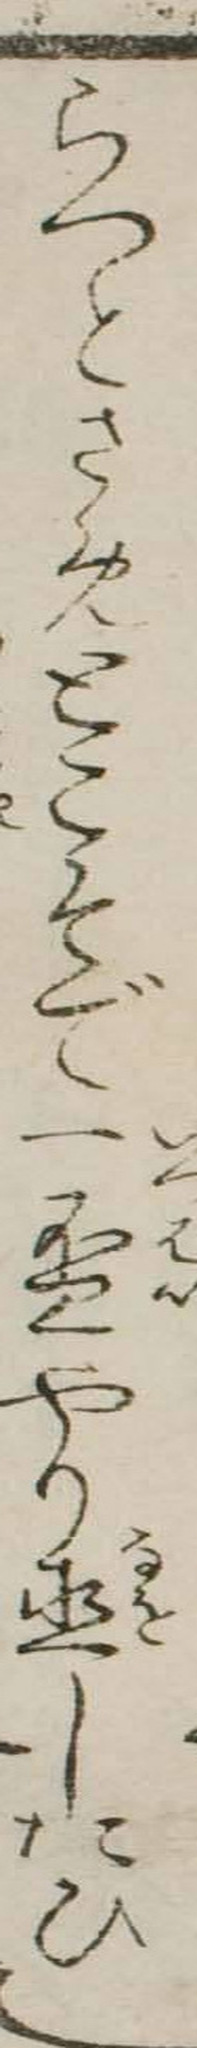らつとさめとこそで一盃やり直したひ
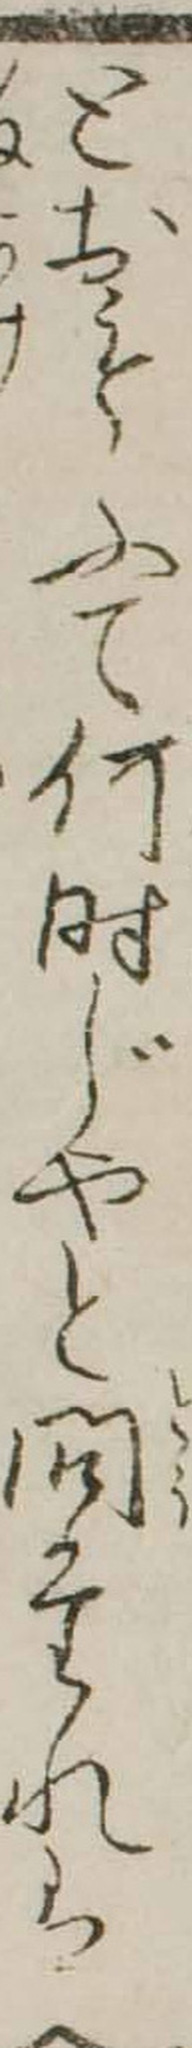とおもふて何時じやと問たれは
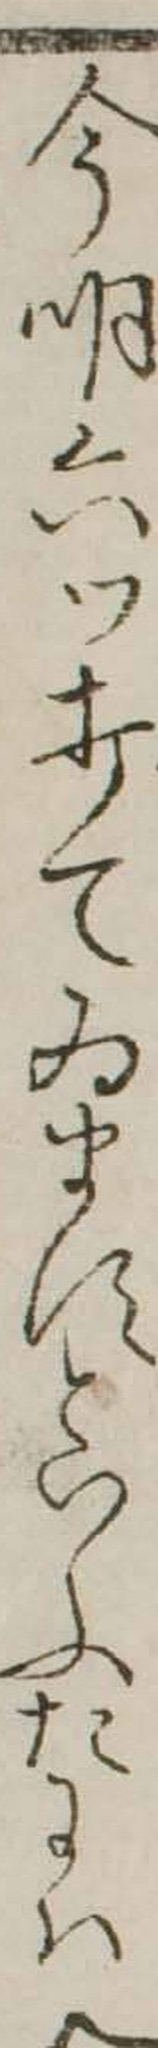今明六ッ打てゐますといふたには
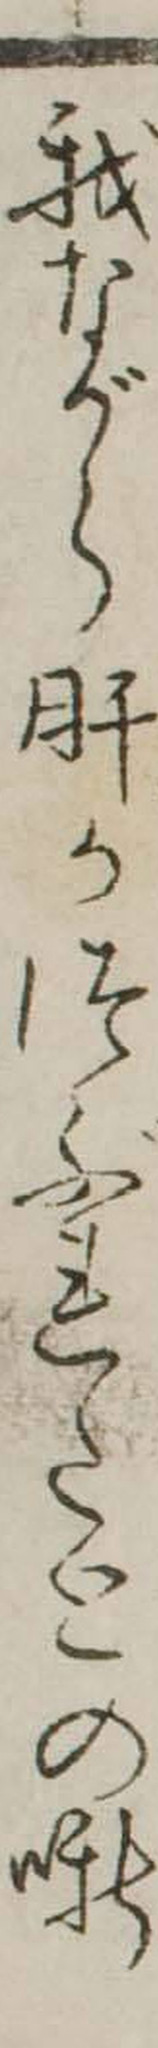我ながら肝かつぶれたとの噺
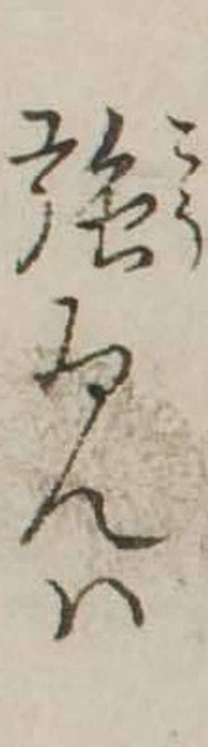強ゐんは
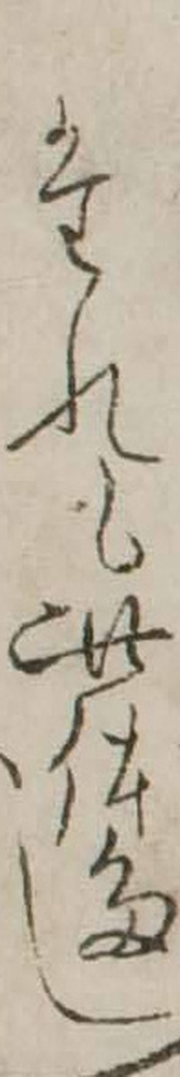たれも此体多し

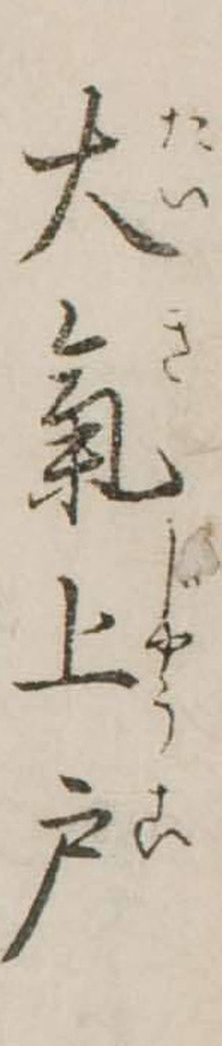大気上戸
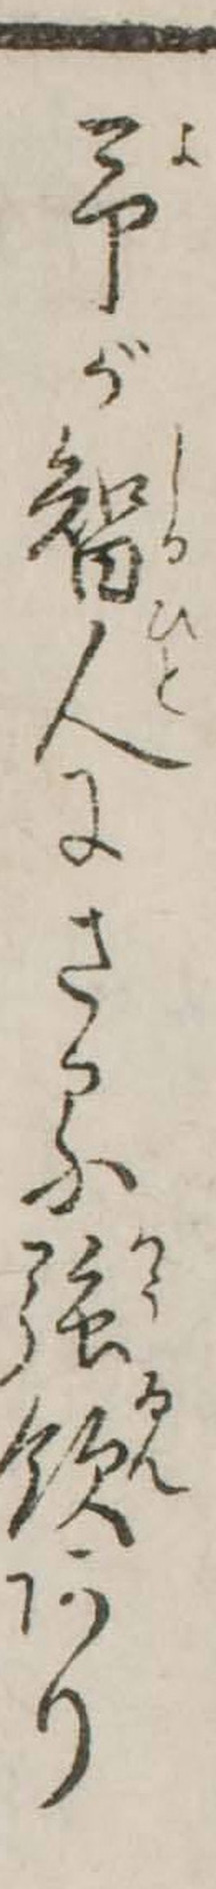予が智人にさる強飲あり
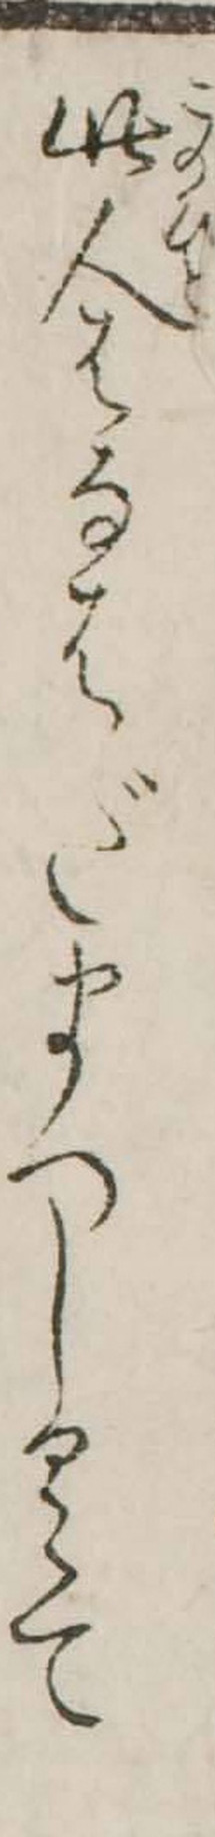此人はなはだまつしくて
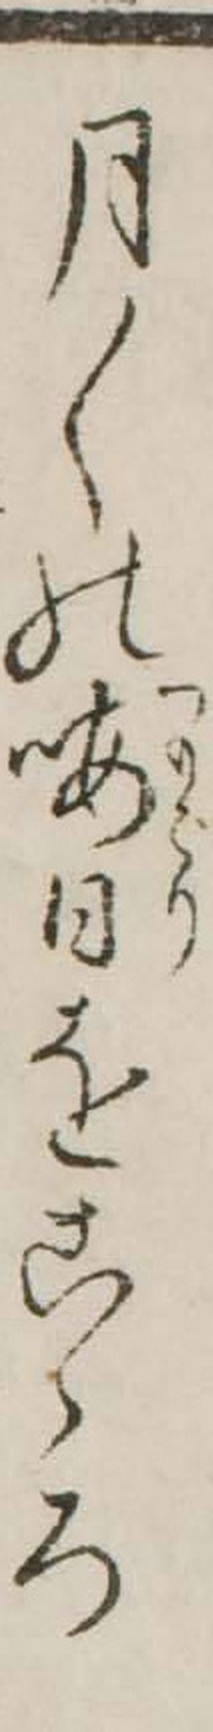月〳〵の晦日をこゝろ
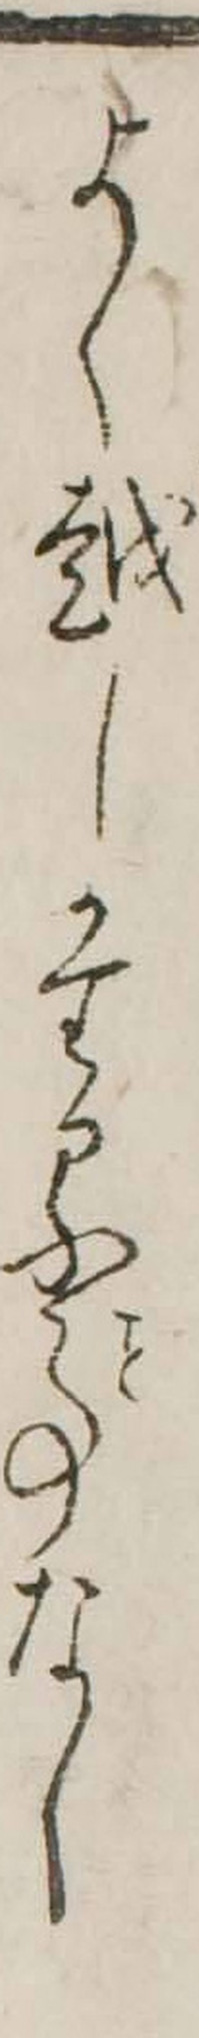よく越したる事なし
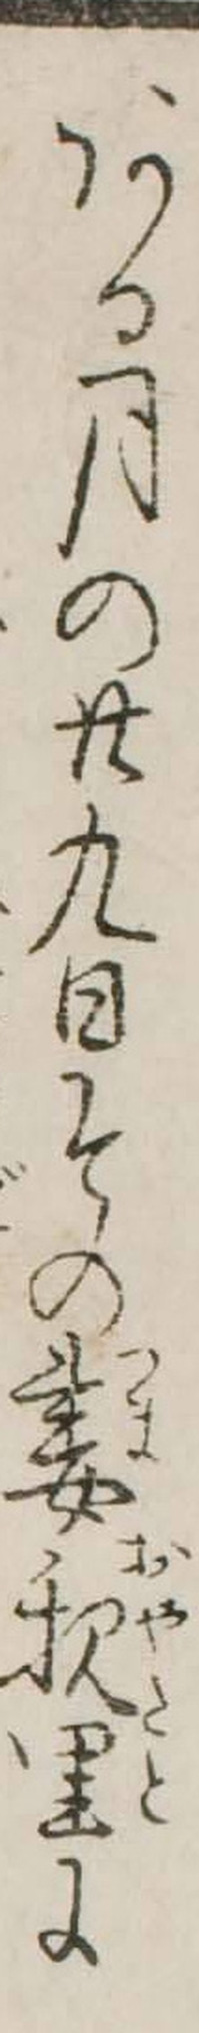ある月の廿九日その妻親里に
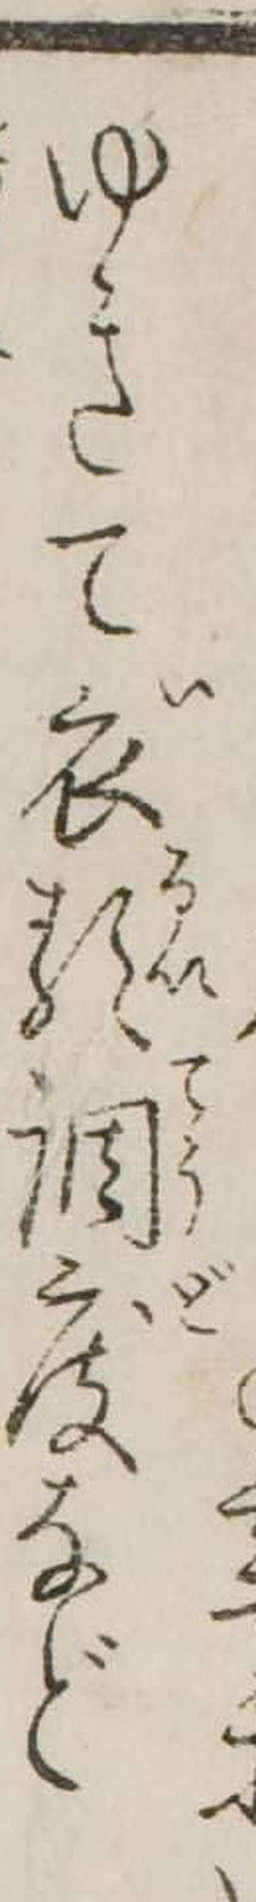ゆきて衣類調度など
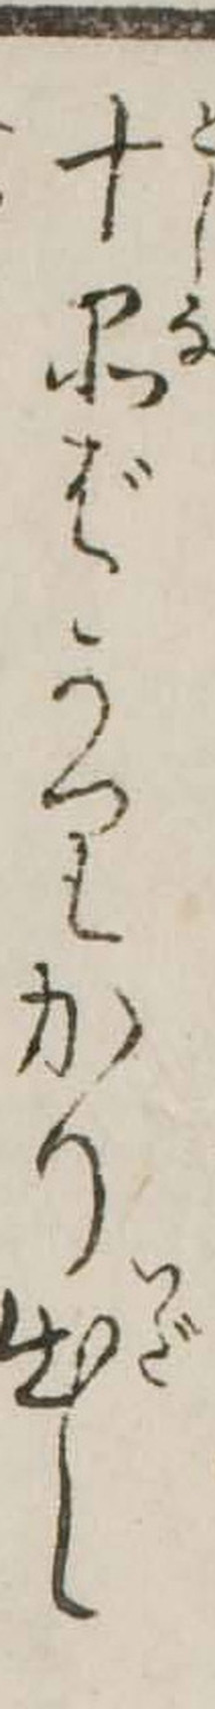十品ばかりかり出し
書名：繪本不盡泉
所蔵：国文学研究資料館
